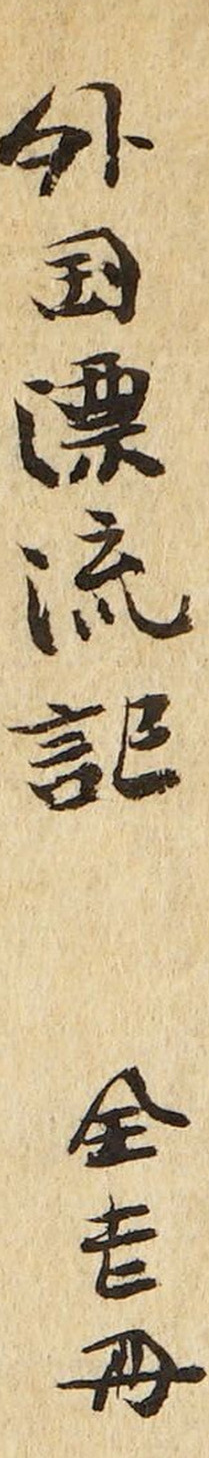外国漂流記全壱冊
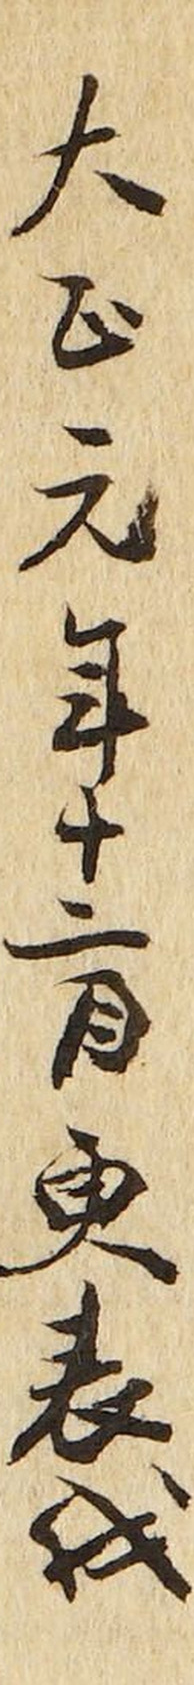大正元年十二月更表紙
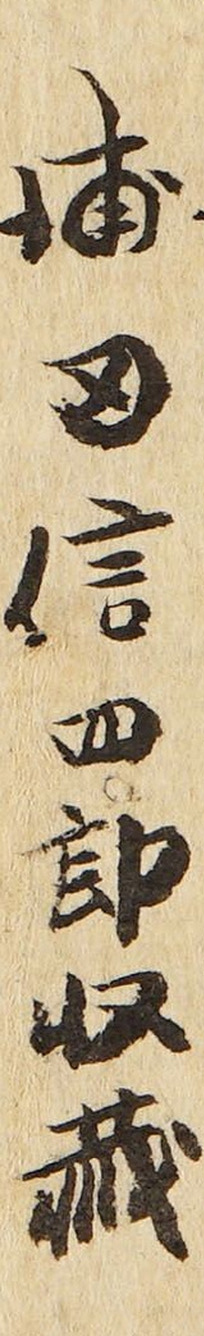浦田信四郎収蔵
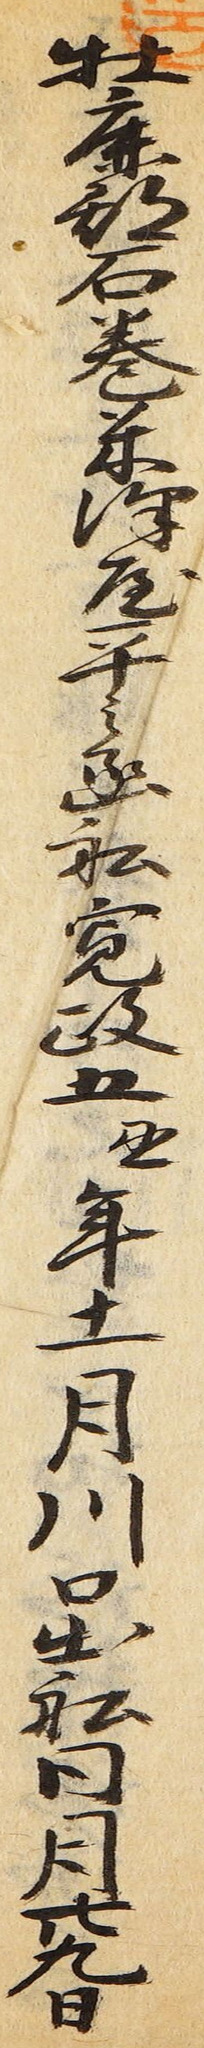牡鹿郡石巻米津屋平之丞船寛政五丑年十一月川口出船同月廿九日
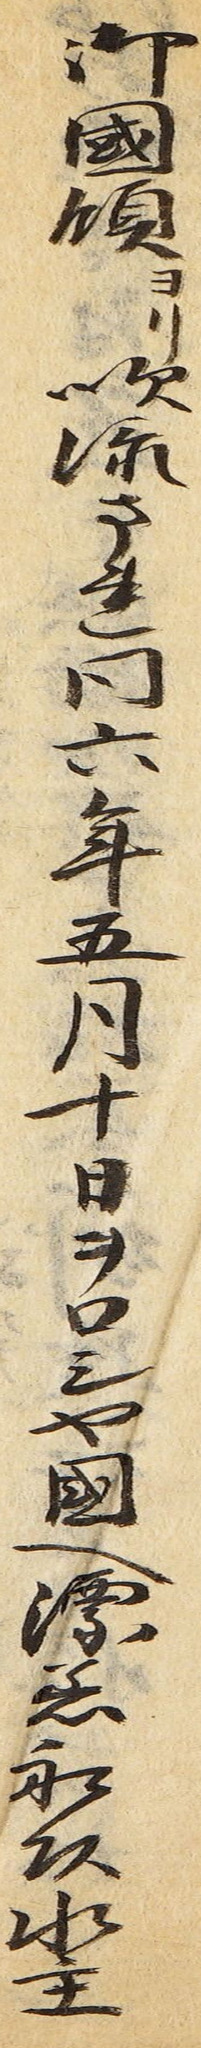御国領吹流され同六年五月十日ヲロシヤ国へ漂着船頭水主
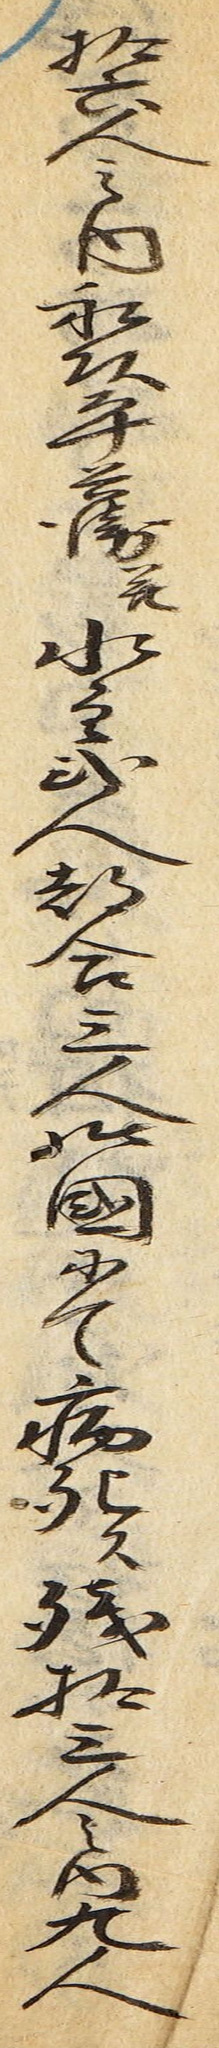拾六人之内船頭平兵衛并水主弐人都合三人此国にて病死残拾三人之内九人
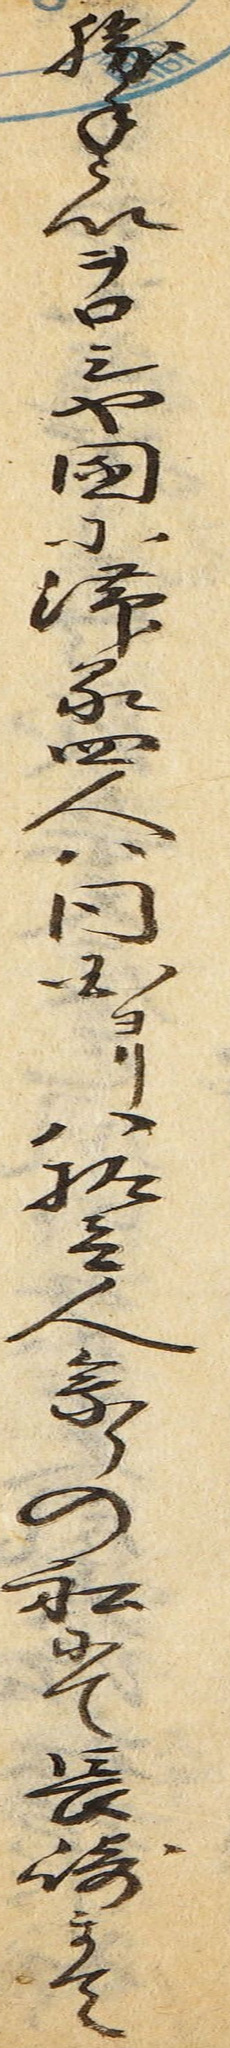勝手を以ヲロシヤ国に滞る四人は同国八拾壱人乗りの船にて長崎まて
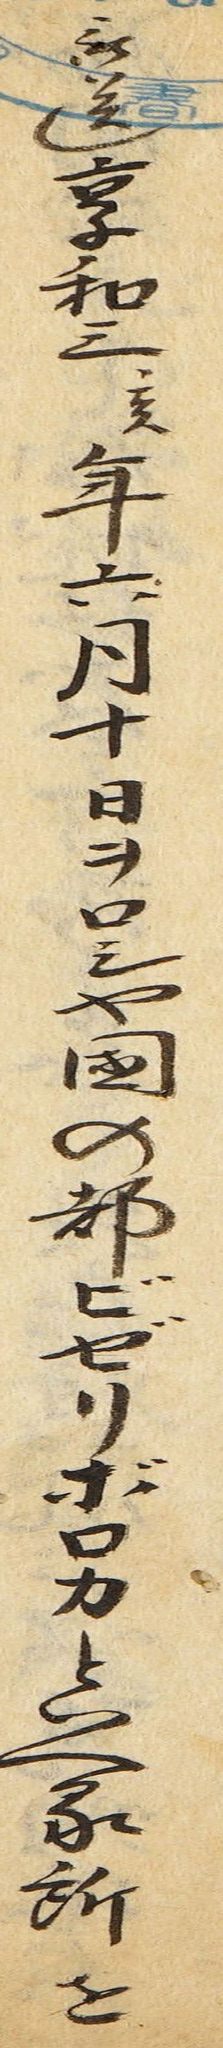被送享和三亥年六月十日ヲロシヤ国の都ビゼリボロカといへる所を
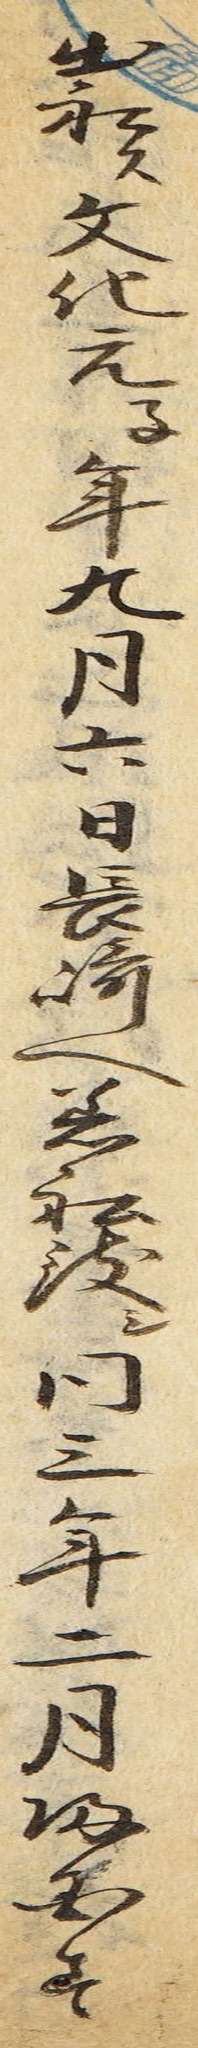出船文化元子年九月六日なが長崎着船致同三年二月帰国す
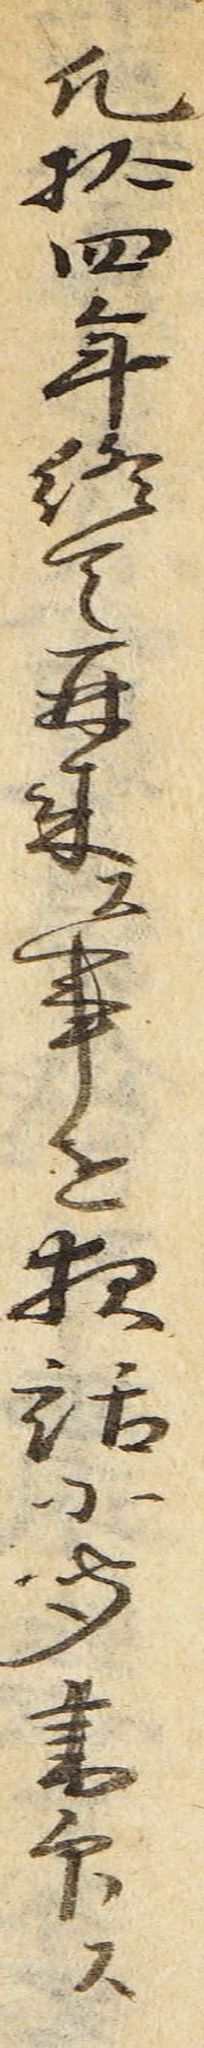凡拾四年終て再来事を夜話に聞書印

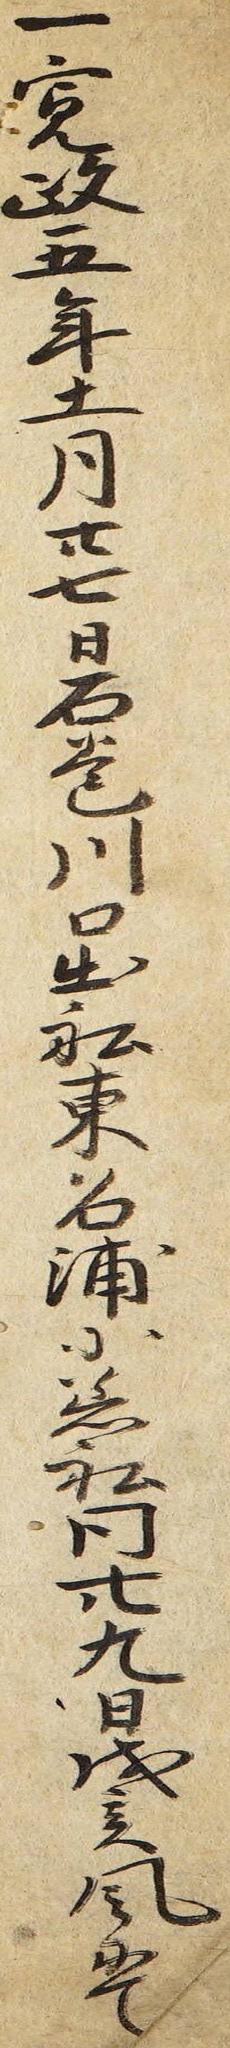一寛政五年十一月廿七日石巻川口出船東石浦に着船同廿九日戊亥風にて
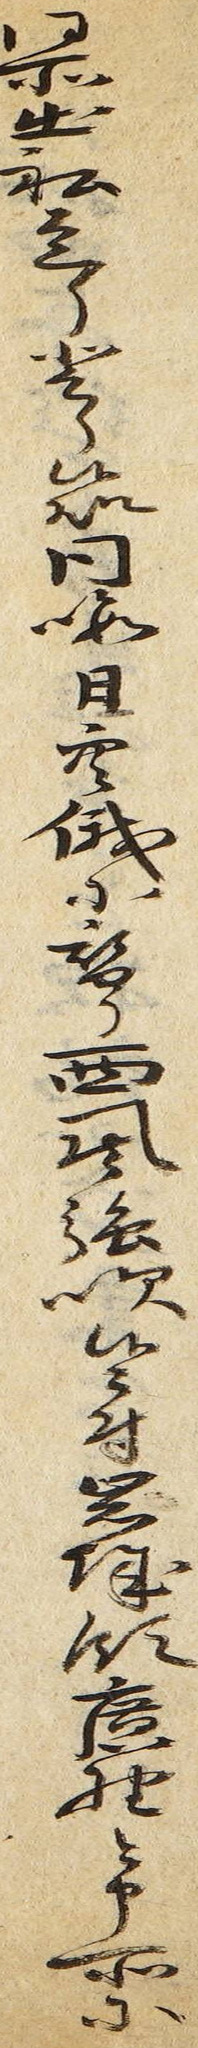同所出船走り登り候処同晦日空俄に替り西風強吹候に付岩城領広野と申所に
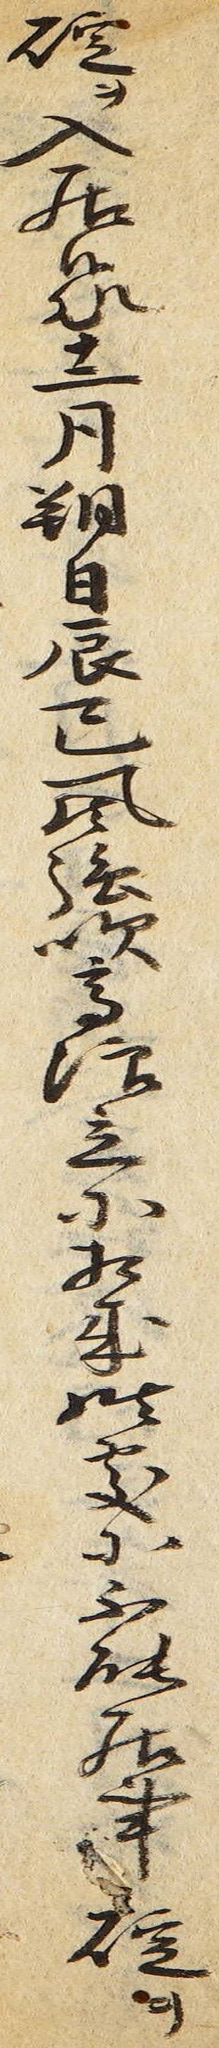碇入居候処十二月朔日辰巳風強吹高浪立に相成此処に不能居事碇
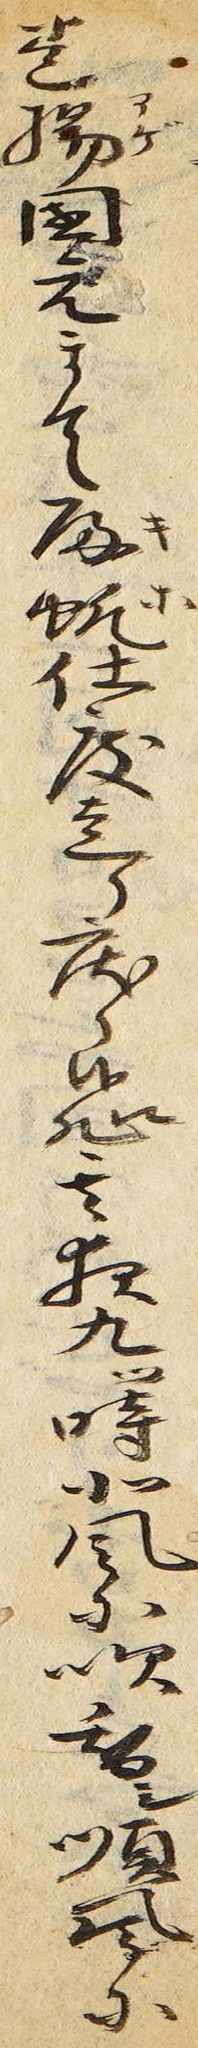巻揚国元まて帰帆仕度走り戻り候処其夜九ッ時北風に吹替順風に
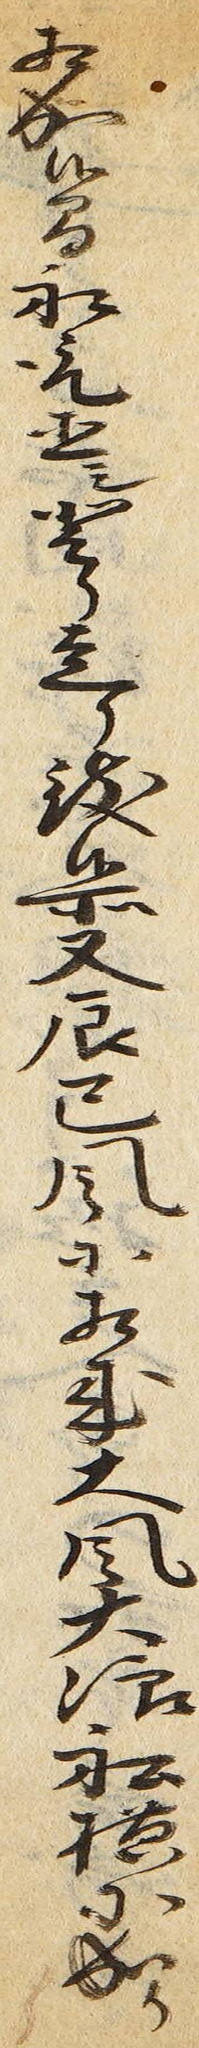相成候間船取直登り走り致候所又辰巳風に相成大風大浪船横に成り
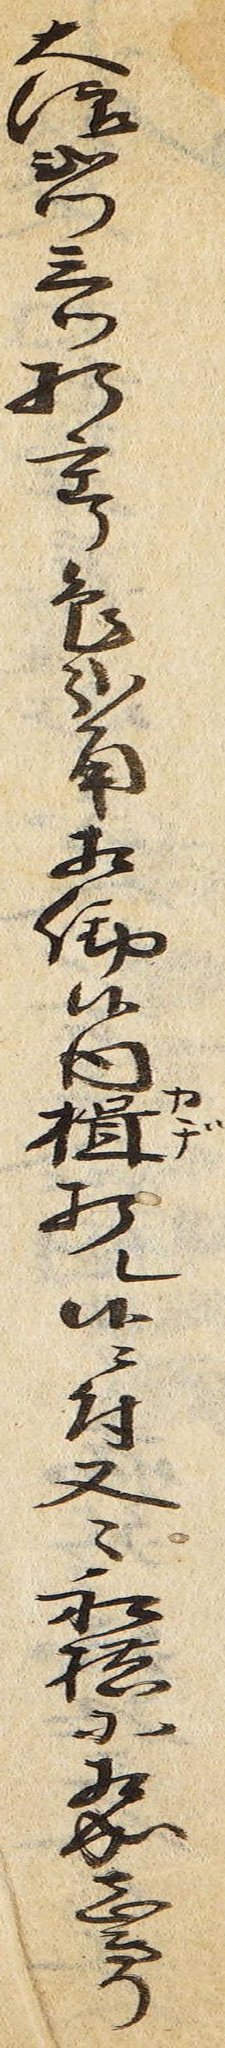大浪弐つ三つ折重り兎弐角相働候内楫折れ候に付又々船横に相成しきり
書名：外国漂流記
